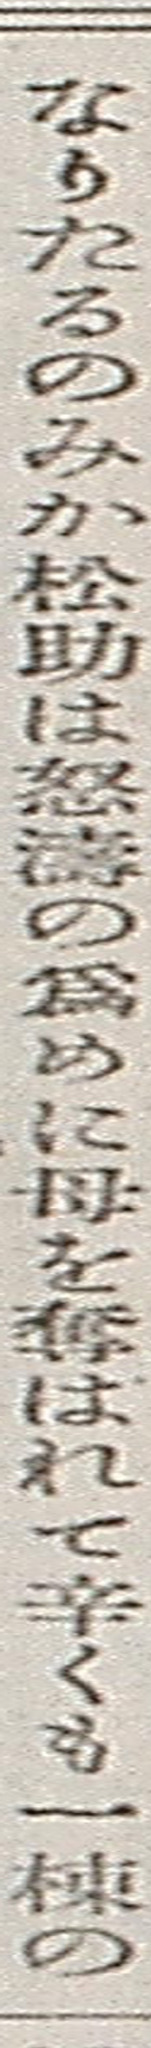なりたるのみか松助は怒濤の為めに母を奪はれて辛くも一棟の
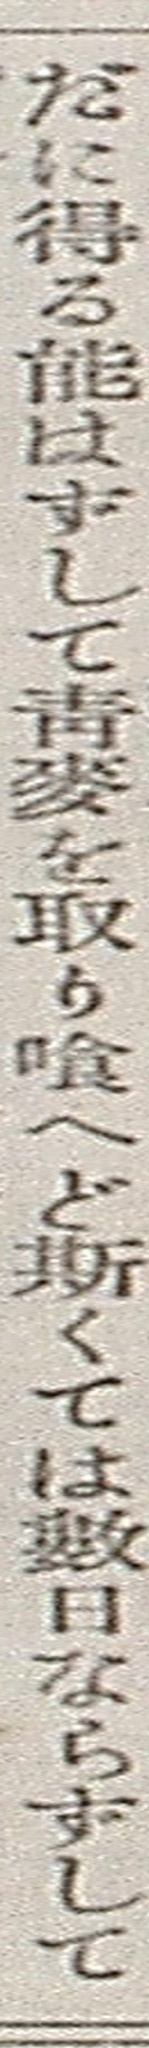だに得る能はずして青麦を取り喰へど斯くては数日ならずして
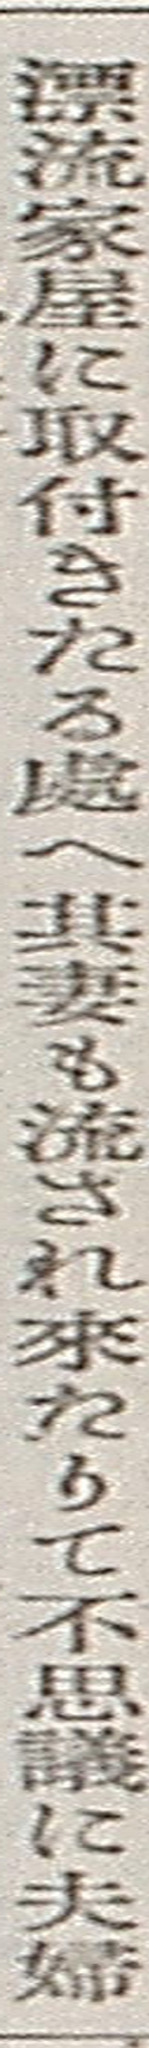漂流家屋に取付きたる処へ其妻も流され来たりて不思議に夫婦
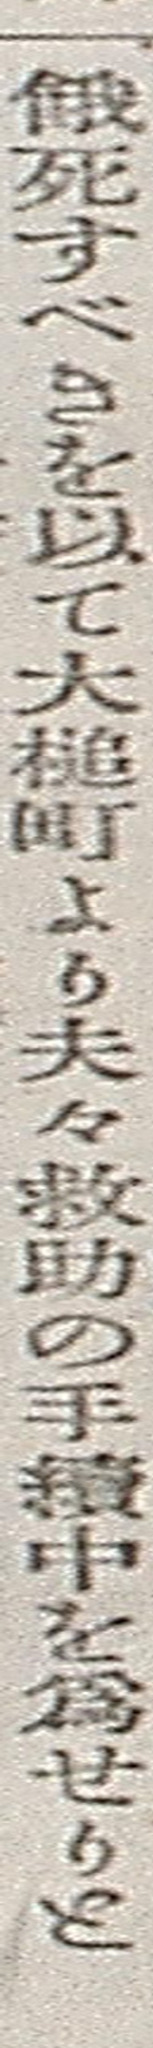餓死すべきを以て大槌町より夫々救助の手続中を為せりと
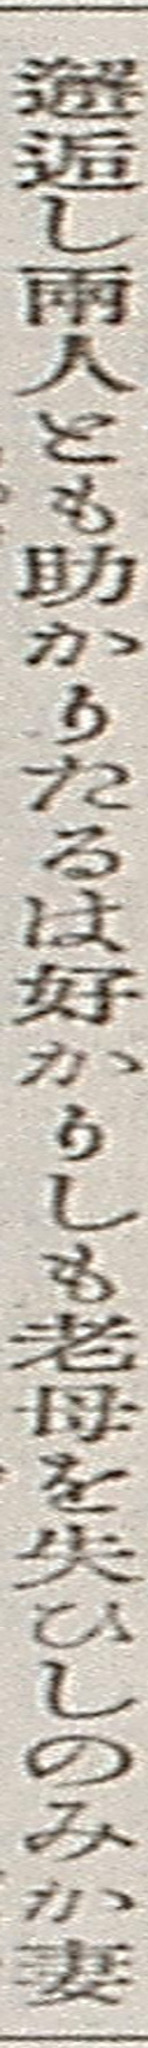邂逅し両人とも助かりたるは好かりしも老母を失ひしのみか妻
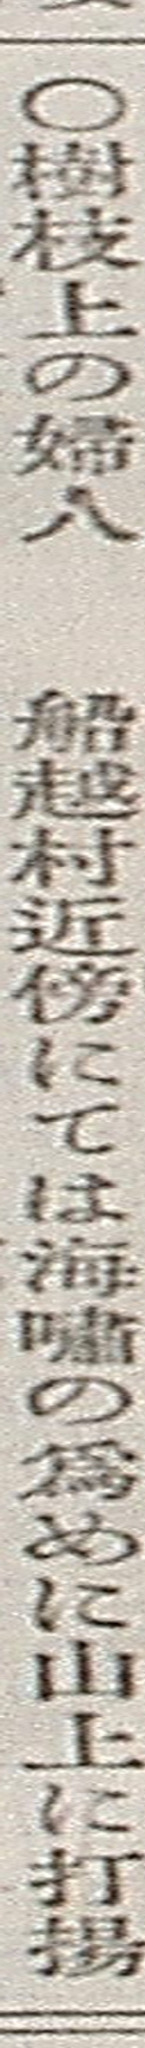○樹枝上の婦人船越村近傍にては海嘯の為めに山上に打揚
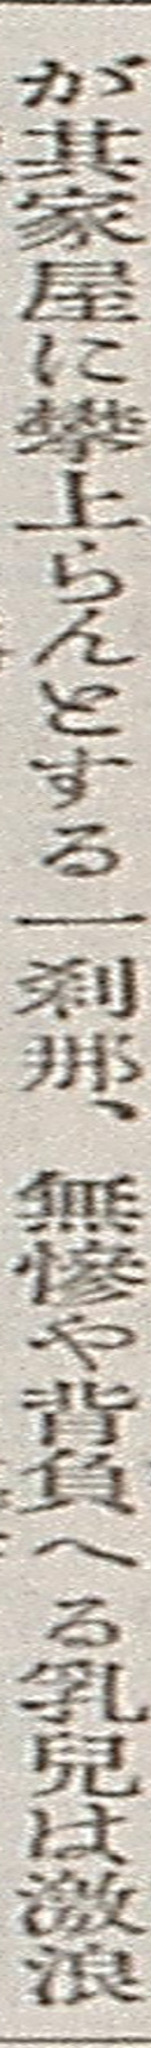が其家屋に攀上らんとする一刹那、無惨や背負へる乳児は激浪
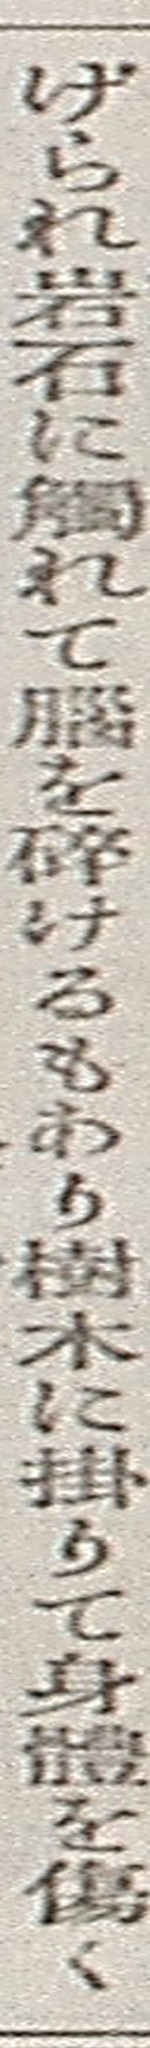げられ岩石に触れて脳を砕けるもあり樹木に掛りて身体を傷く
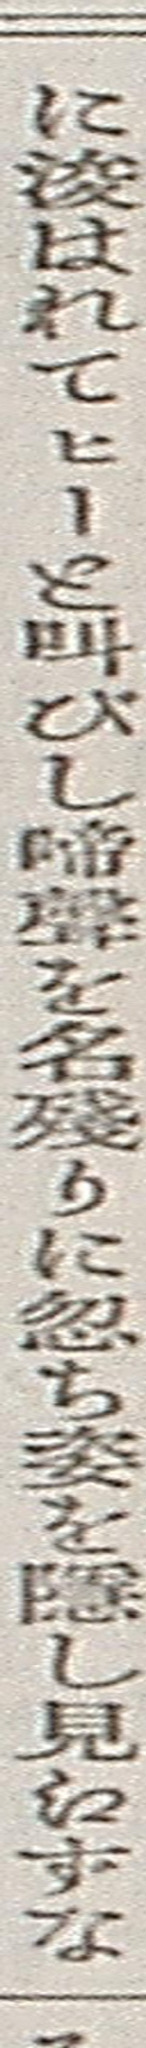に浚はれてヒーと叫びし啼声を名残りに忽ち姿を隠し見えずな
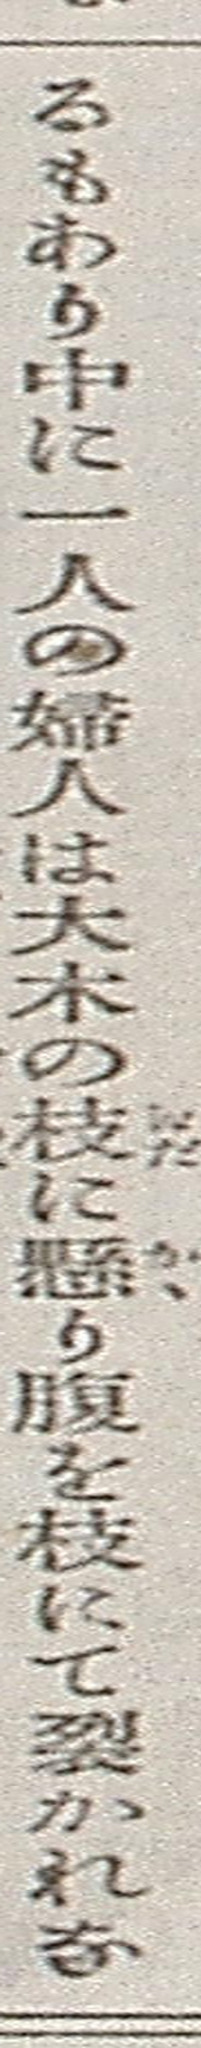るもあり中に一人の婦人は大木の枝に懸り腹を枝にて裂かれな
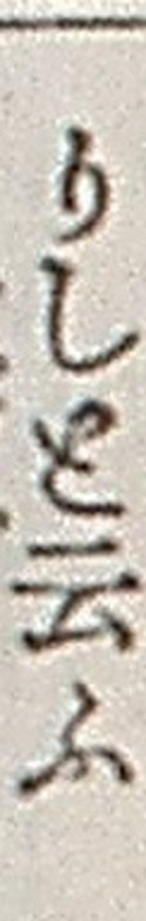りしと云ふ
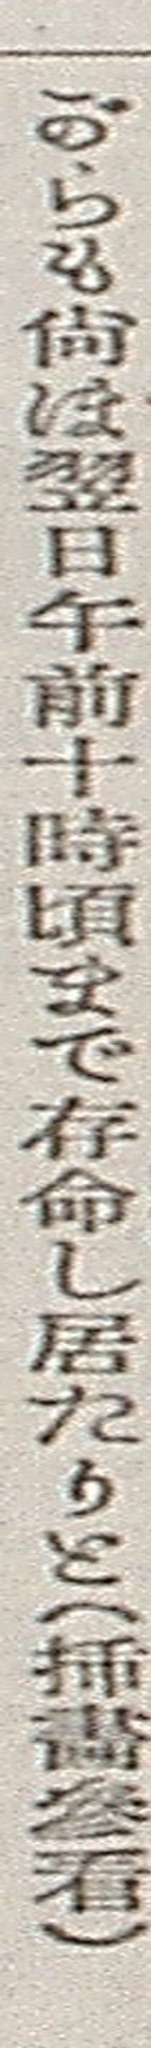がらも尚ほ翌日午前十時頃まで存命し居たりと
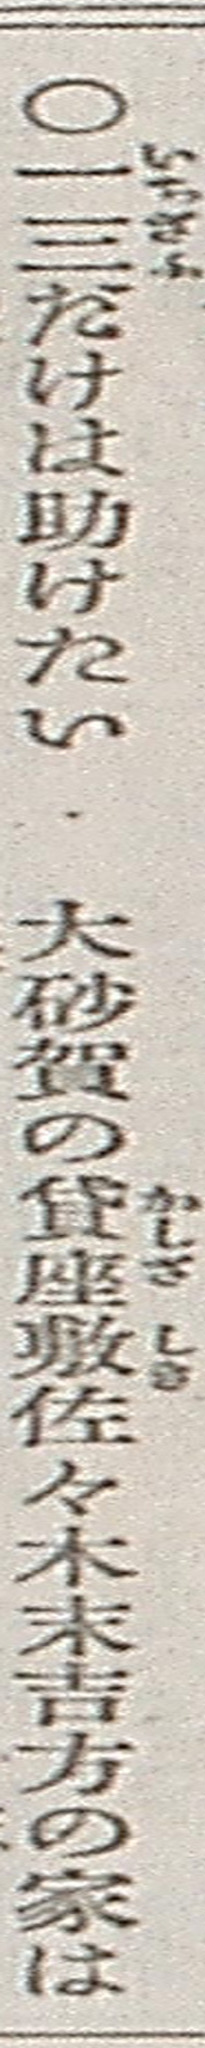○一三だけは助けたい大砂賀の貸座敷佐々木末吉方の家は
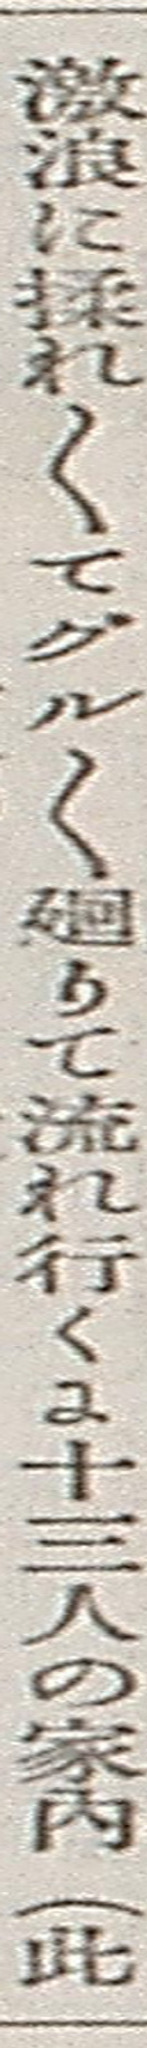激浪に揉れ〳〵てグル〳〵廻りて流れ行くに十三人の家内（此
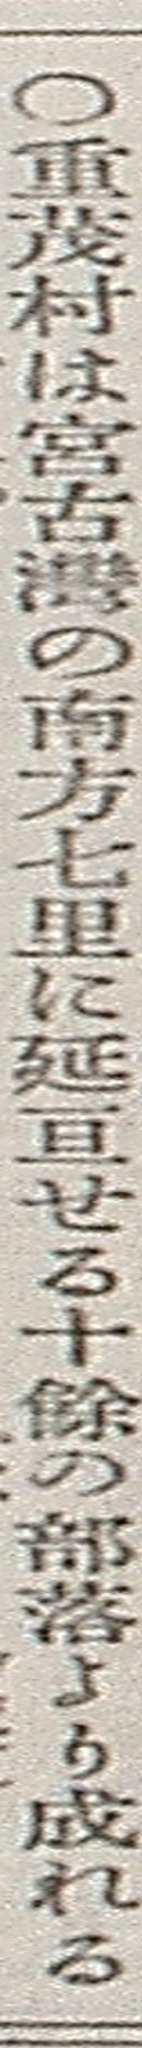○重茂村は宮古湾の南方七里に延亘せる十余の部落より成れる
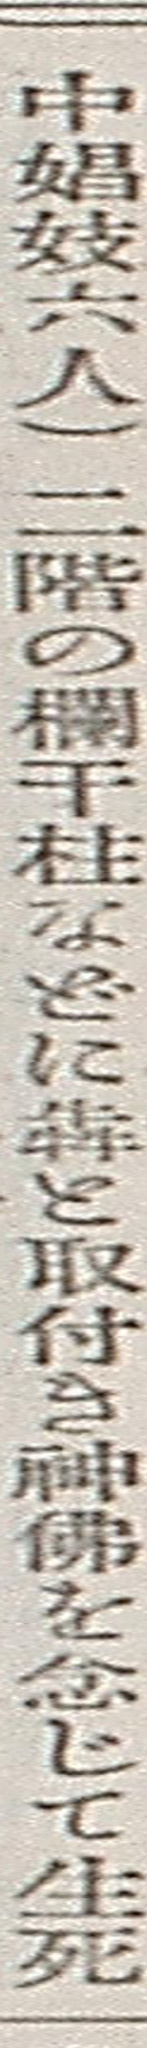中娼妓六人）二階の欄干柱などに犇と取付き神仏を念じて生死
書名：風俗畫報臨時増刊第百十九號　大海嘯被害録（中）
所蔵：東京大学地震研究所図書室 Earthquake Research Institute Library, The University of Tokyo, JAPAN
